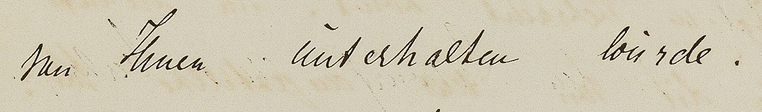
von Ihnen unterhalten würde.
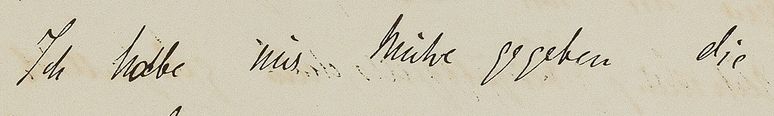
Ich habe mir Mühe gegeben die
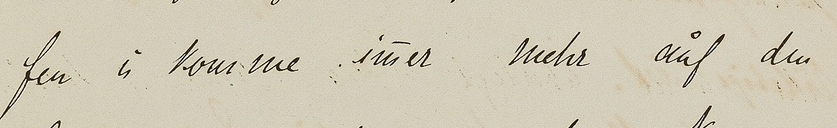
fen u komme immer mehr auf den
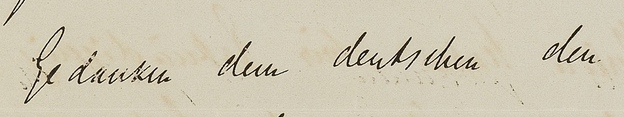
Gedanken dem Deutschen den
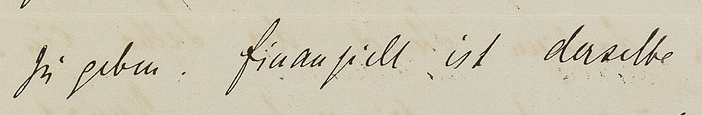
zu geben. Finanziell ist derselbe
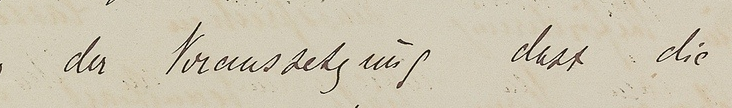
der Voraussetzung dass die
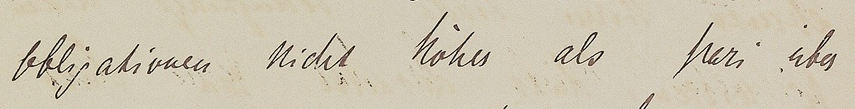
Obligationen nicht höher als pari über-
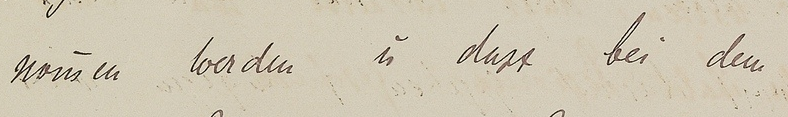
nommen werden u dass bei dem
